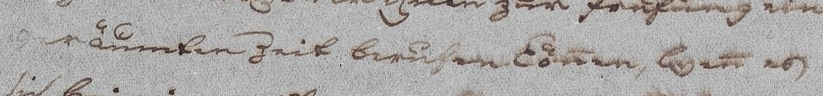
geräumten Zeit berufen können, wenn es
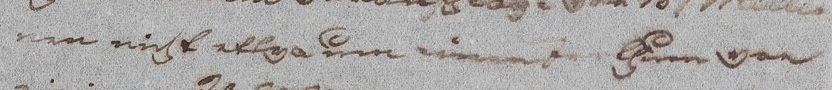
nen nicht etwa um einen Irrthum von
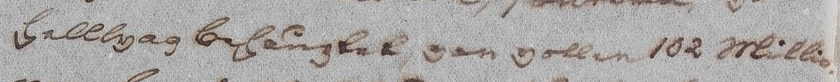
Hellwag behauptet, von vollen 102 Millio-
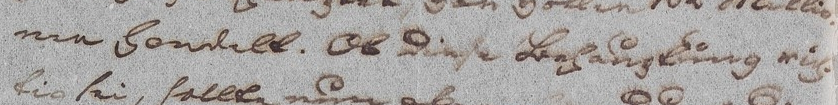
nen handelt. Ob diese Behauptung rich-
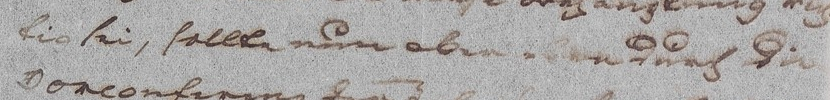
tig sei, sollte nun aber eben durch die
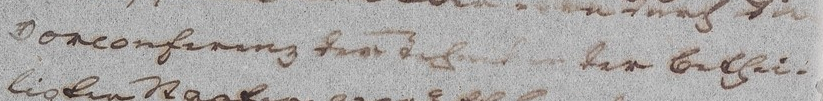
Vorconferenz der Techniker der bethei-
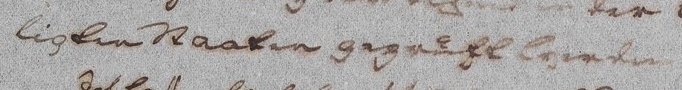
ligten Staaten geprüft werden.
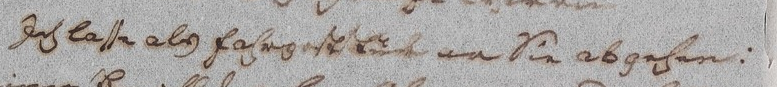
Ich lasse als Fahrpoststücke an Sie abgehen:
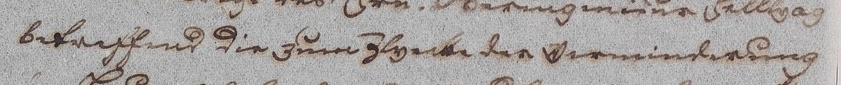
betreffend die zum Zwecke der Verminderung
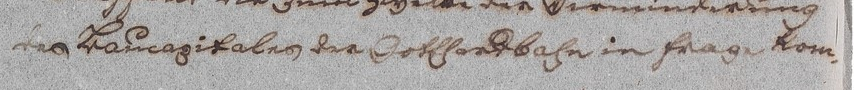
des Baucapitales der Gotthardbahn in Frage kom-
